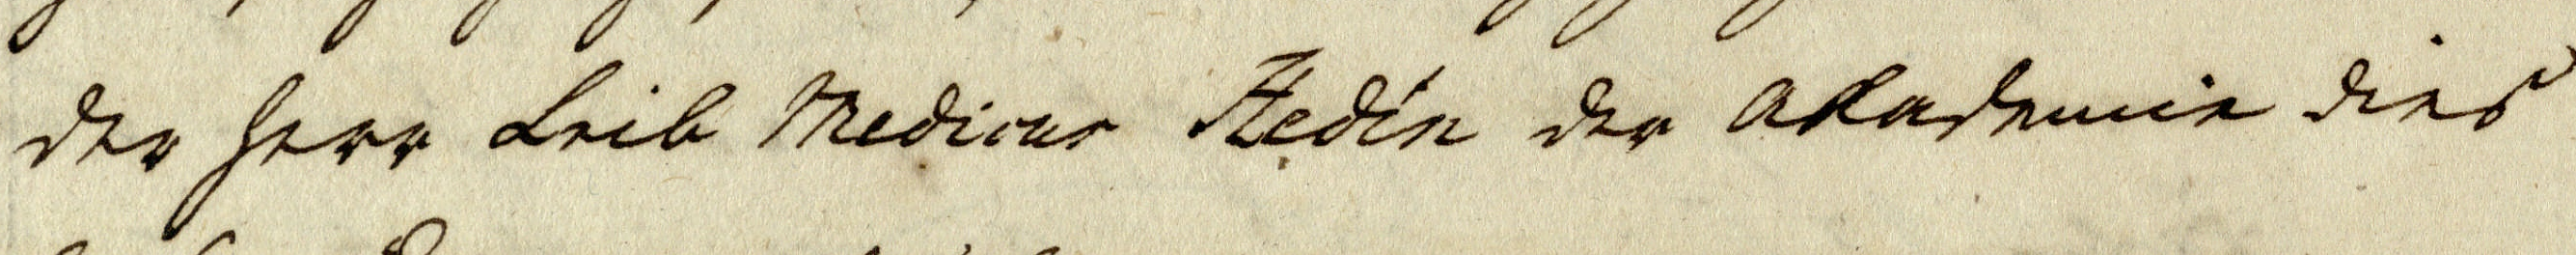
der Herr Leib Medicus Hedin der Akademie dies
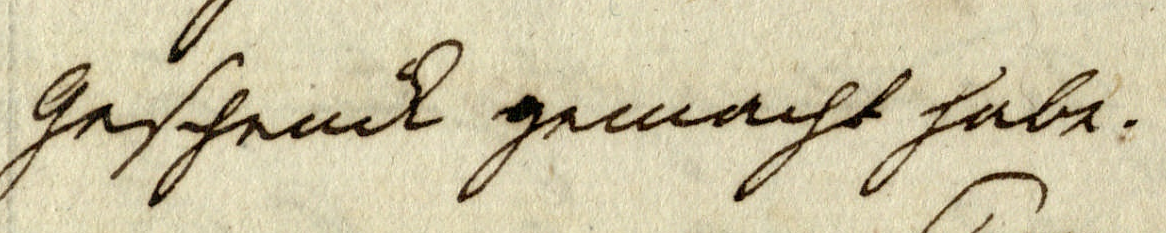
Geschenck gemacht habe.
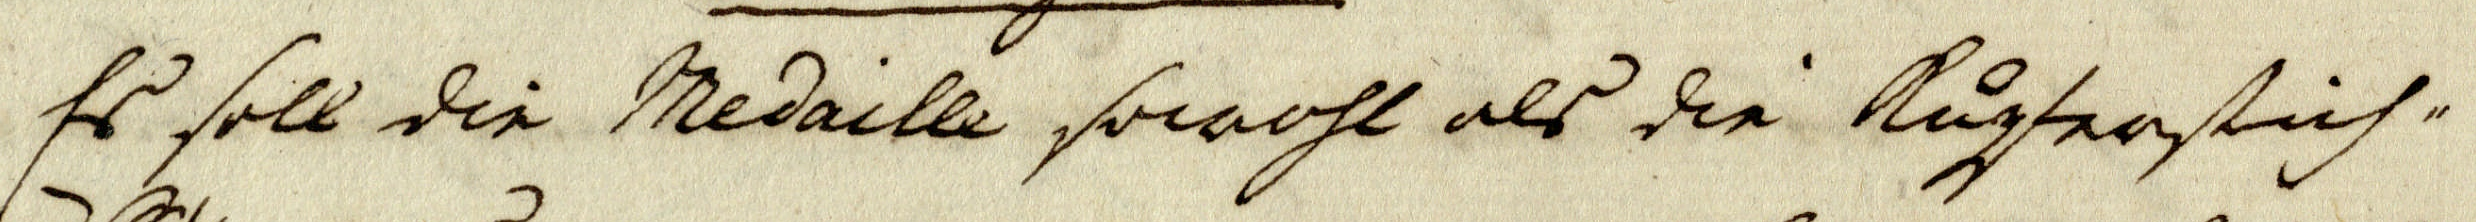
Es soll die Medaille sowohl als die Kupterstich¬
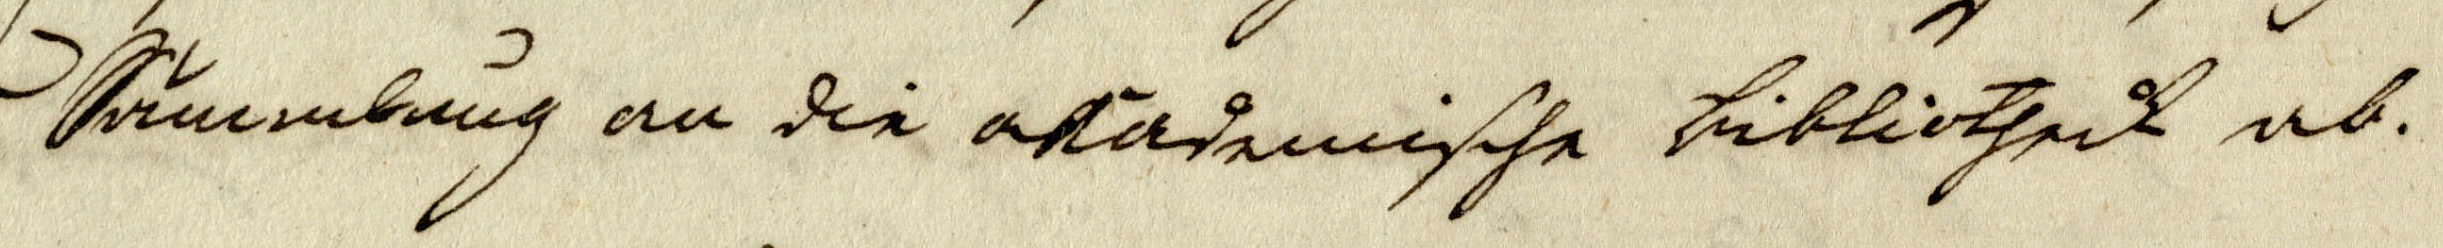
Sammlung an die akademische Bibliothek ab¬
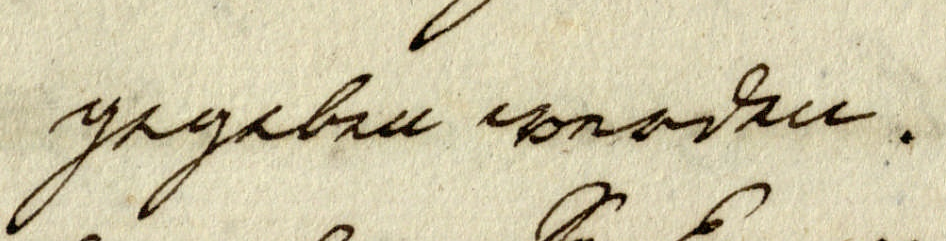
gegeben werden.
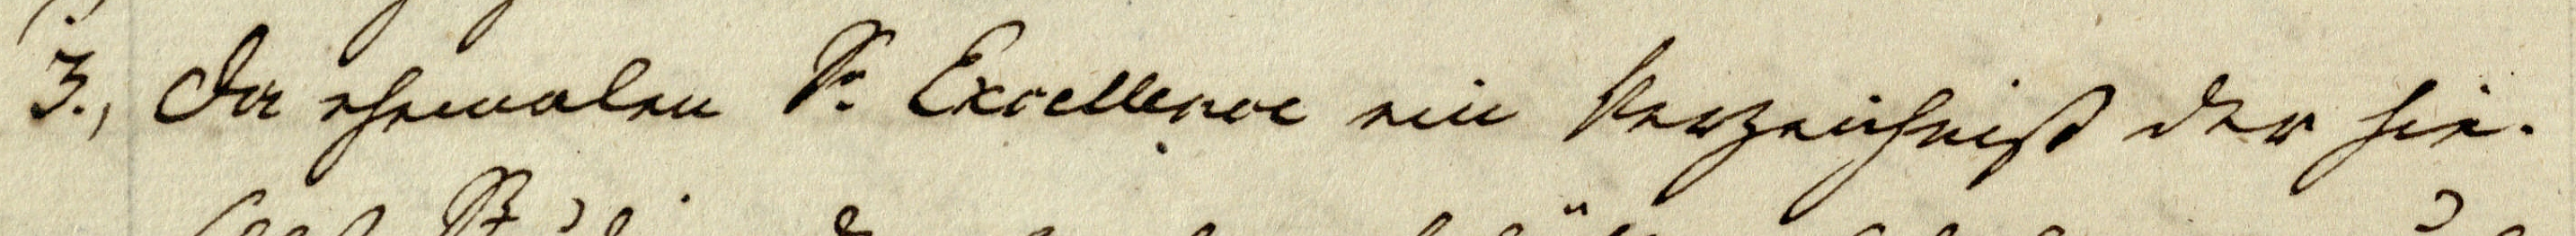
3., Da ehemalen Sr Excellence ein Verzeichniß der hie¬
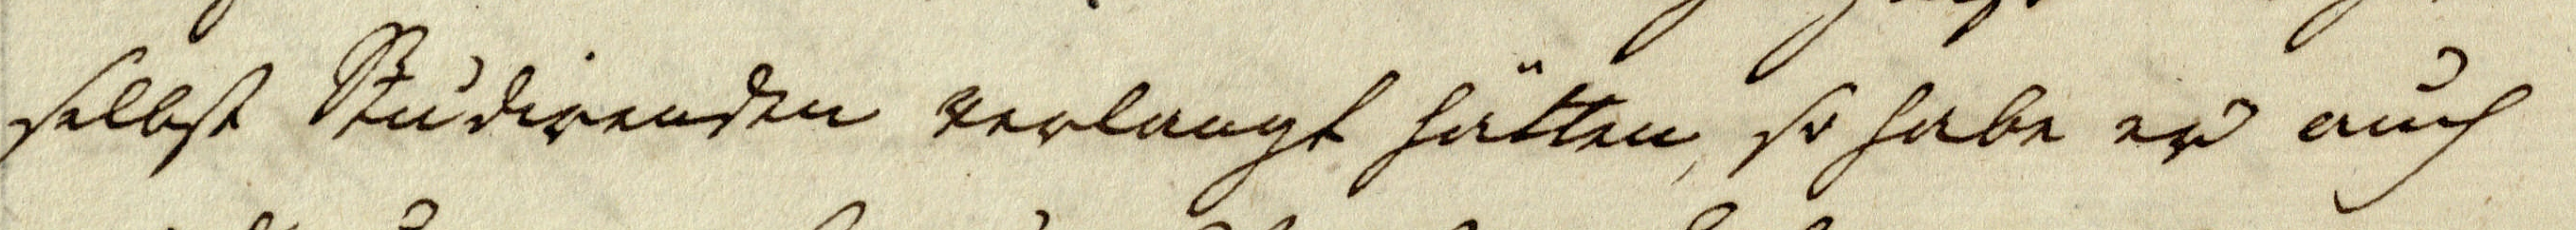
selbst Studirenden verlangt hätten, so habe er auch
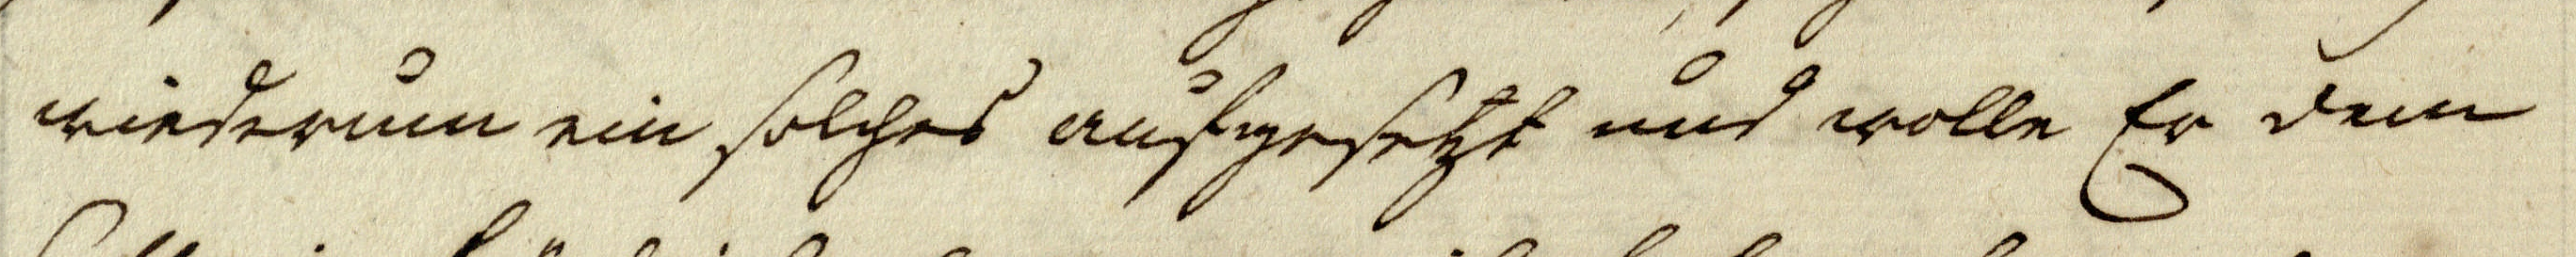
wiederum ein solches aufgesetzt und wolle Er dem
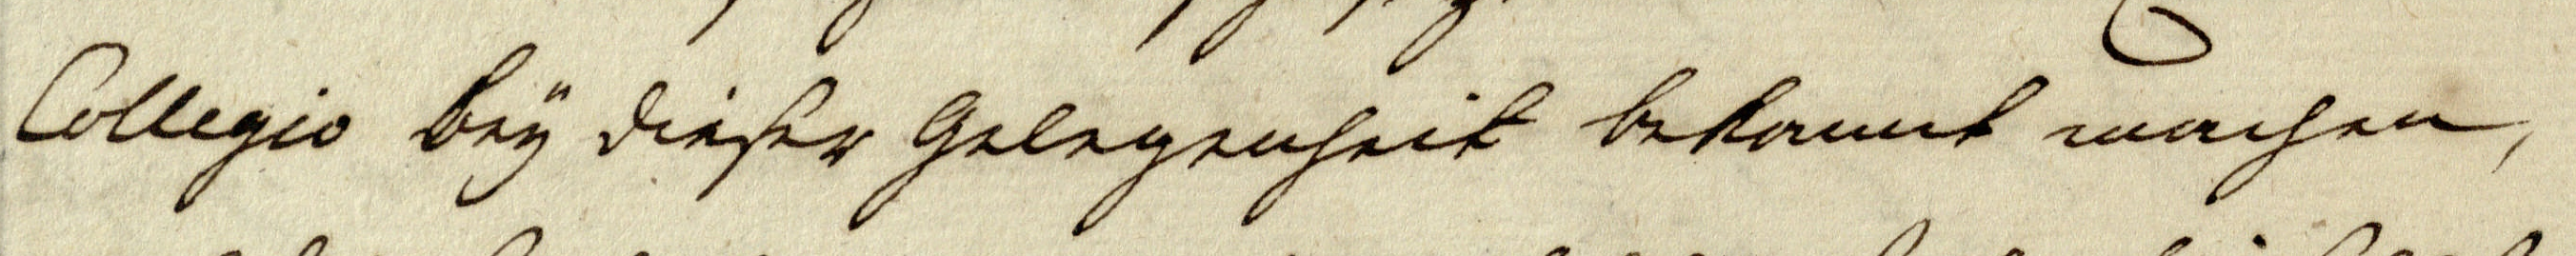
Collegio beÿ dieser Gelegenheit bekannt machen,
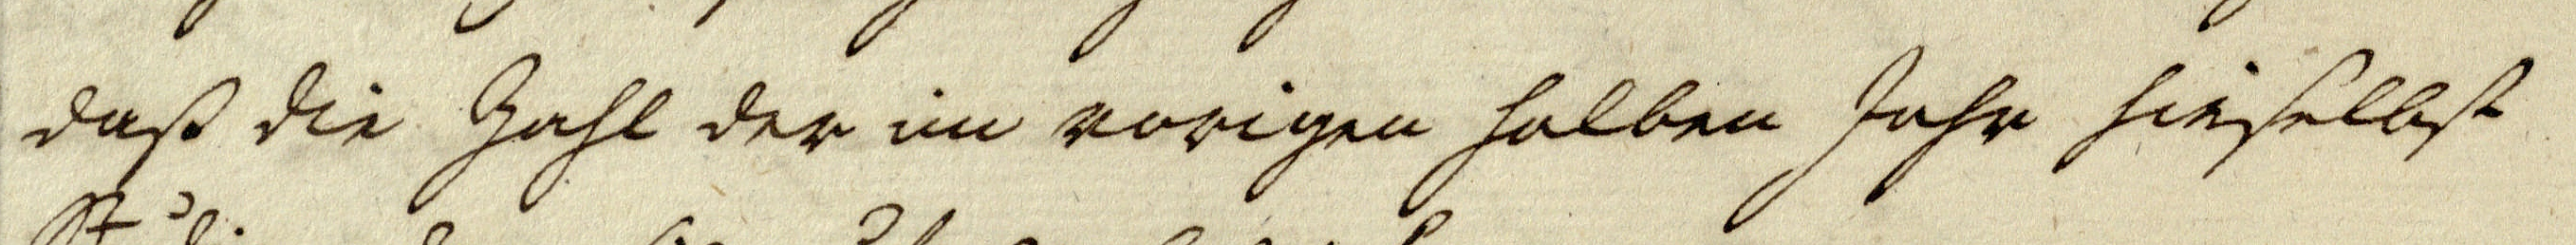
daß die Wahl der im vorigen halben Jahr hieselbst
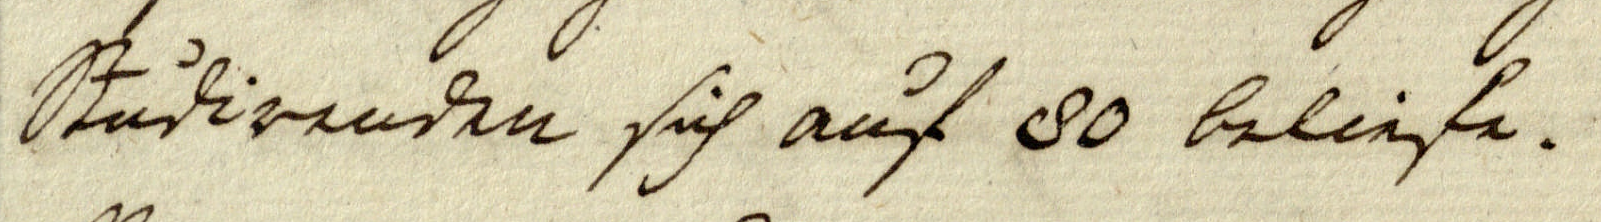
Studirenden sich auf 80 beliefe.
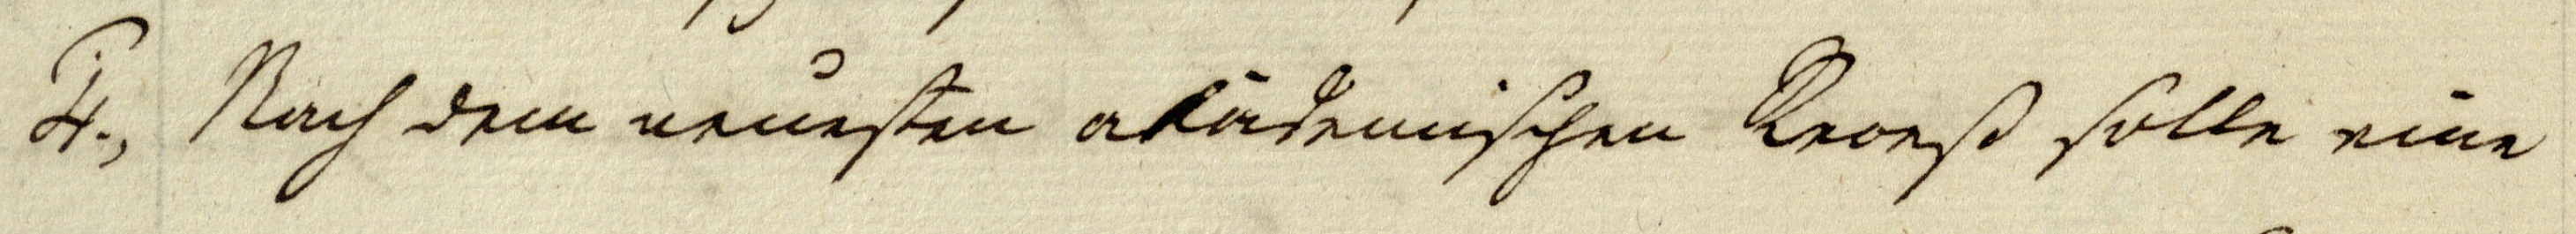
2. Nach dem neuesten akademischen Receß solle eine
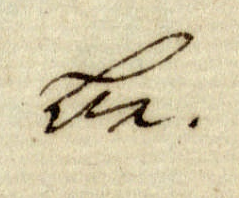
Be.
